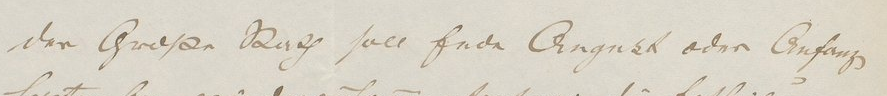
Der Große Rath soll Ende August oder Anfangs
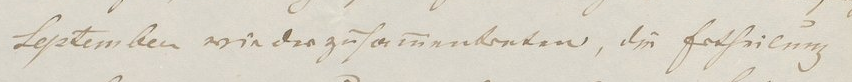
September wieder zusammentreten, die Ertheilung
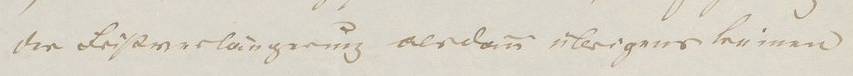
der Fristverlängerung alsdann übrigens keinen
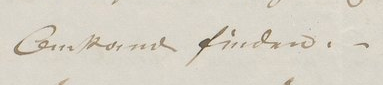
Anstand finden. –
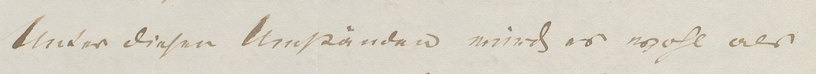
Unter diesen Umständen wird es wohl als
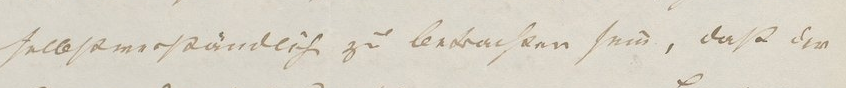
selbstverständlich zu betrachten sein, daß der
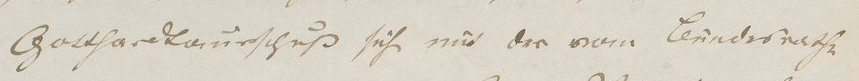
Gotthardtausschuß sich mit der vom Bundesrathe
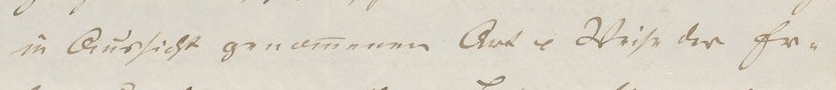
in Aussicht genommenen Art & Weise der Er-
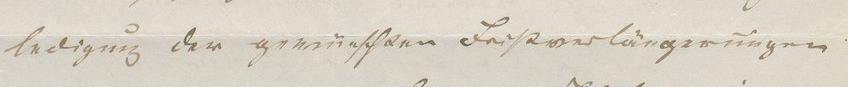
ledigung der gewünschten Fristverlängerungen
